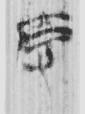皮
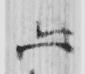上
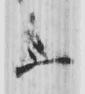之
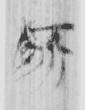所
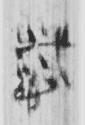慼
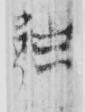邦
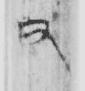又
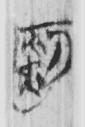{匚炎刀}
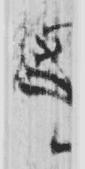{辶殳}
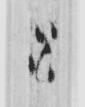水
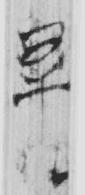旱
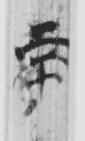不
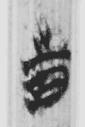{之日}
